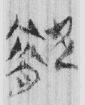{骨欠}
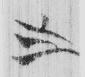之
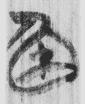卣
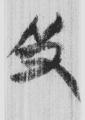及
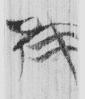隹
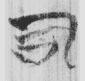司
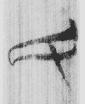民
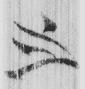之
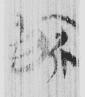所
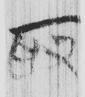取
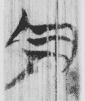今
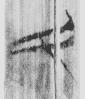民
